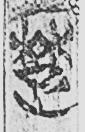楚
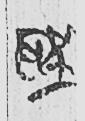聖
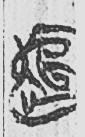𧻚
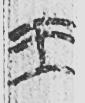王
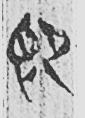即
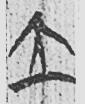立
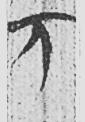兀
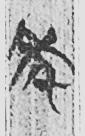年
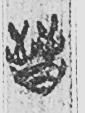晉
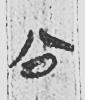公
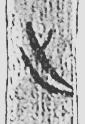止
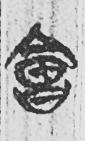會
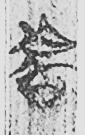者
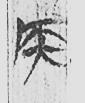侯
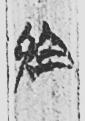於
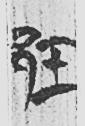{壬阝}
